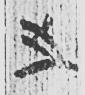之
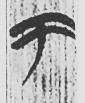于
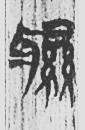{牙㬎}
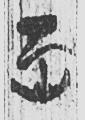{云山}
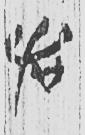左
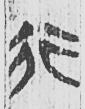行
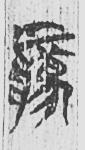{疒蔑}
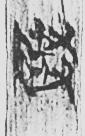{阜圭㕛}
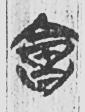會
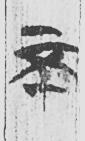不
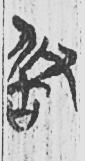敢
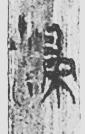{𡴎帚}
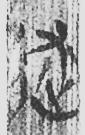述
